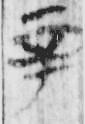辛
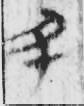丑
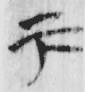下
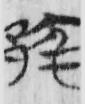○（蔡）
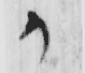人
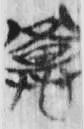畢
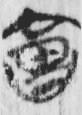會
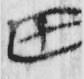甲
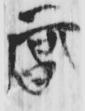晨
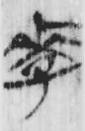李
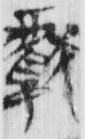狙
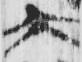大
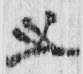之
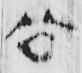公
